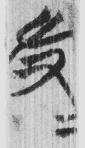{左右}
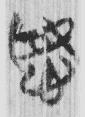悔
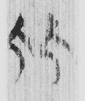比
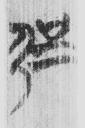{弓口二}
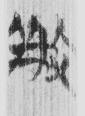{并攴}
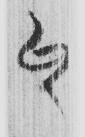丩
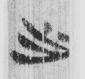出
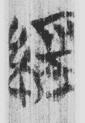經
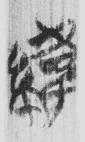緯
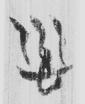{川心}
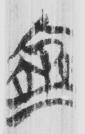齊
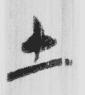土
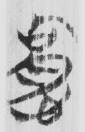悁
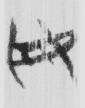母
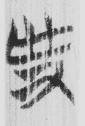拃
